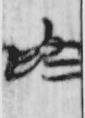爲
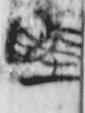陵
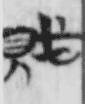貸
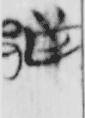○（越）
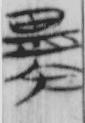異
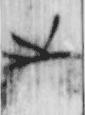之
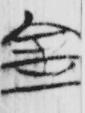金
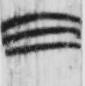三
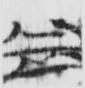益
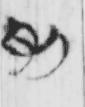刖
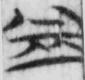益
